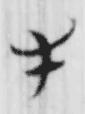牛
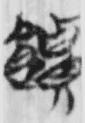饋
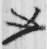之
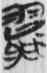○（一）
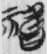禱
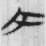文
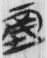坪（平）
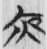○（夜）
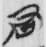君
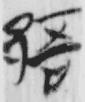郚
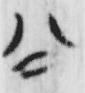公
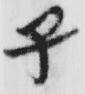子
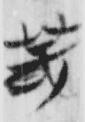○（春）
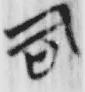司
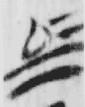馬
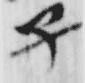子
